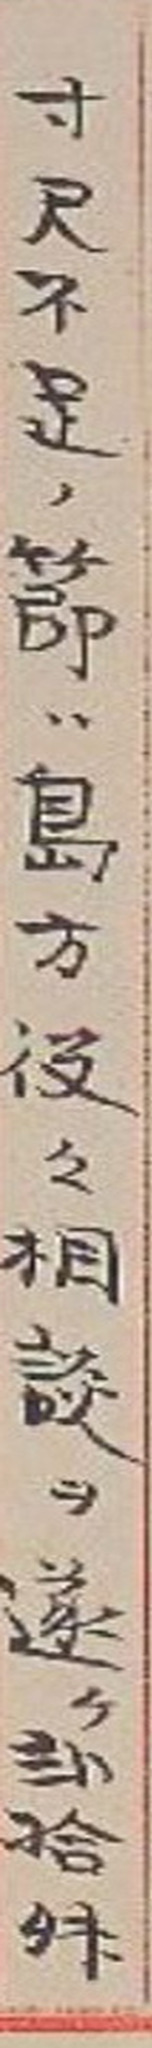寸尺不足ノ節ハ島方役々相談ヲ遂ケ弐拾升
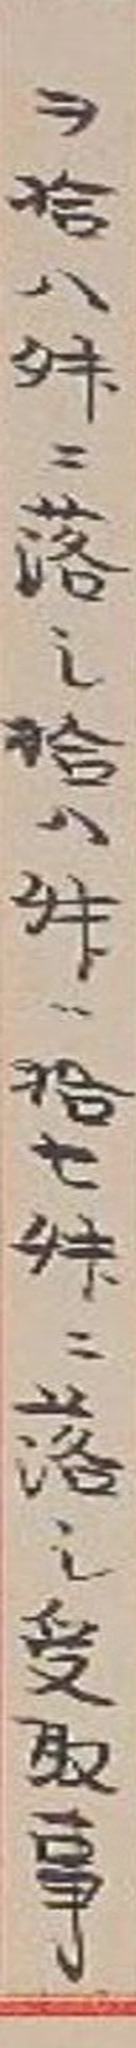ヲ拾八升ニ落シ拾八升ハ拾七升ニ落シ受取事
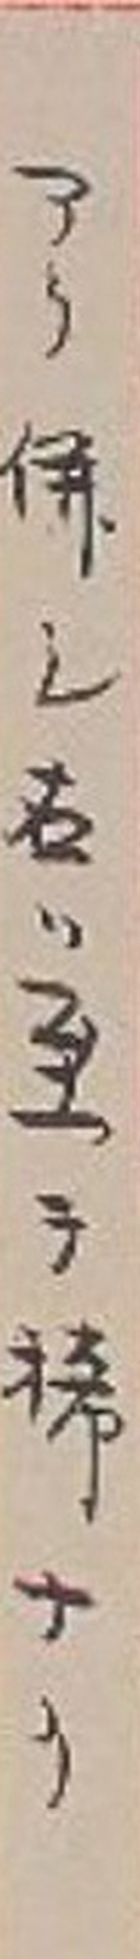アリ併シ右ハ至テ稀ナリ
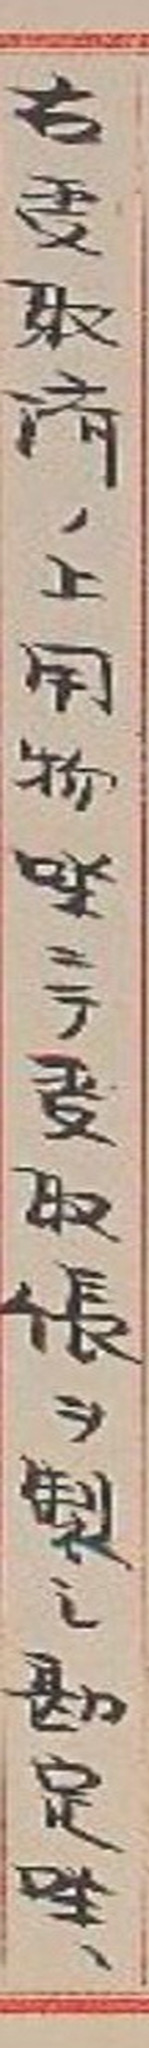右受取済ノ上用物坐ニテ受取帳ヲ製シ勘定坐ヘ
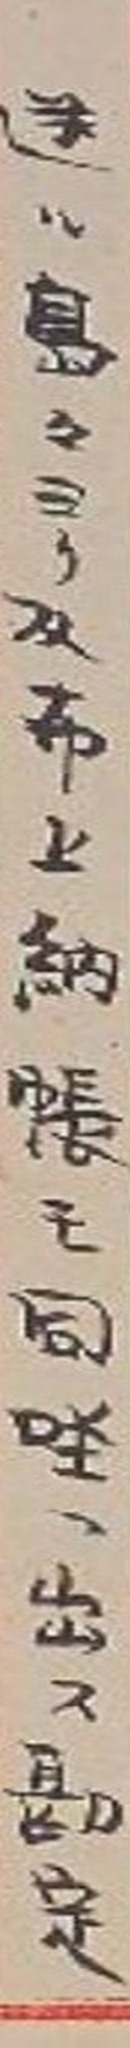送ル島々ヨリ反布上納帳モ同坐ヘ出ス勘定
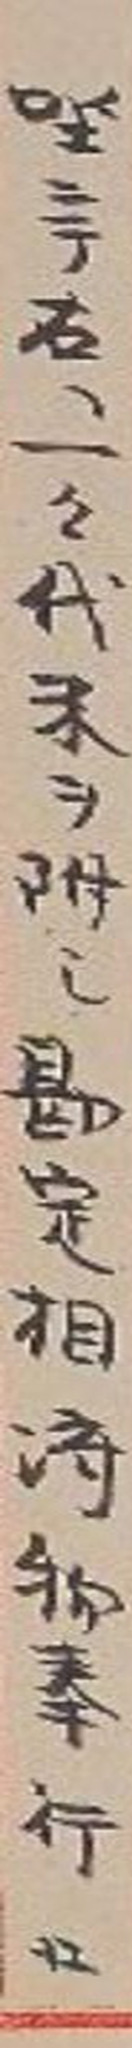坐ニテ右ヘ一々代米ヲ附シ勘定相済物奉行江

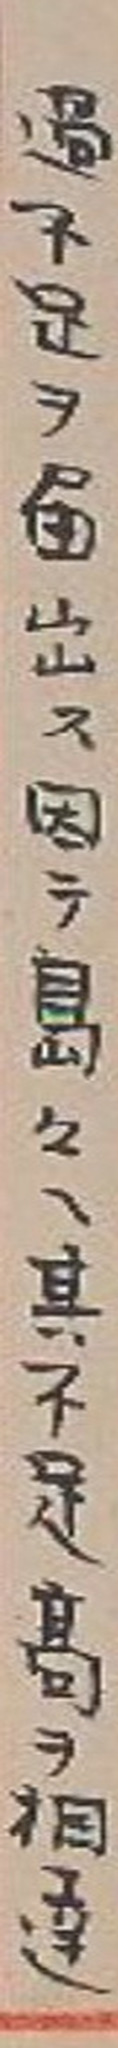過不足ヲ届出ス因テ島々ヘ其不足髙ヲ相達
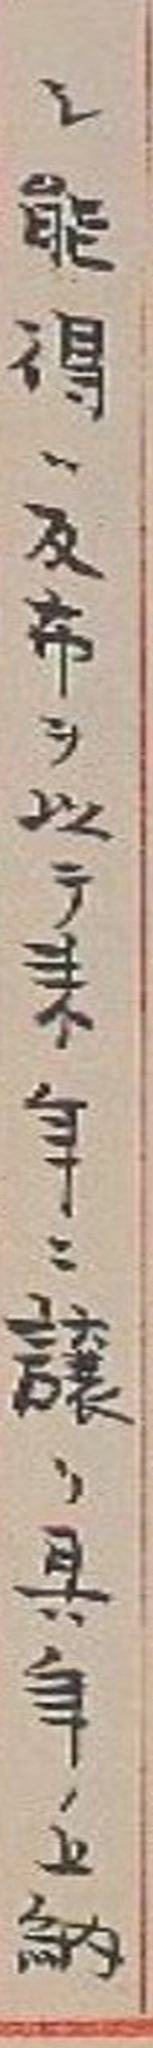シ能得ハ反布ヲ以テ来年ニ譲リ其年ノ上納
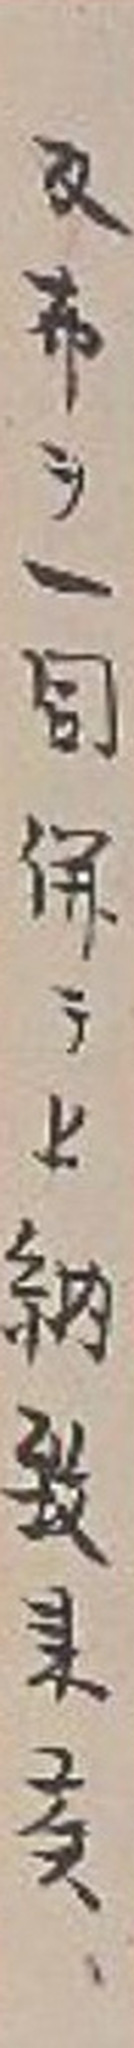反布ヲ一同併テ上納致来候
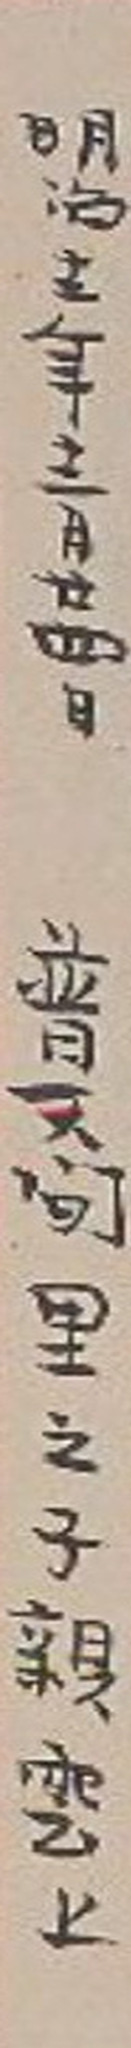明治十二年十二月廿四日普天間里之子親雲上
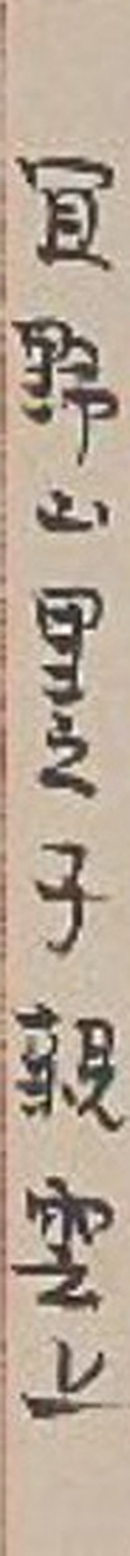宜野座里之子親雲上
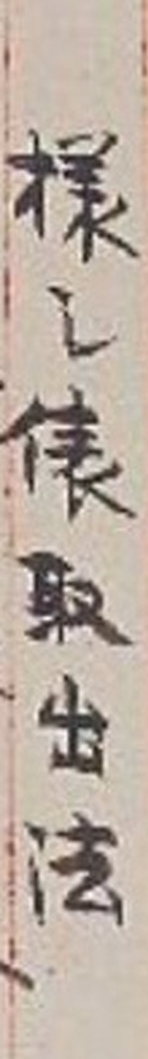様シ俵取出法
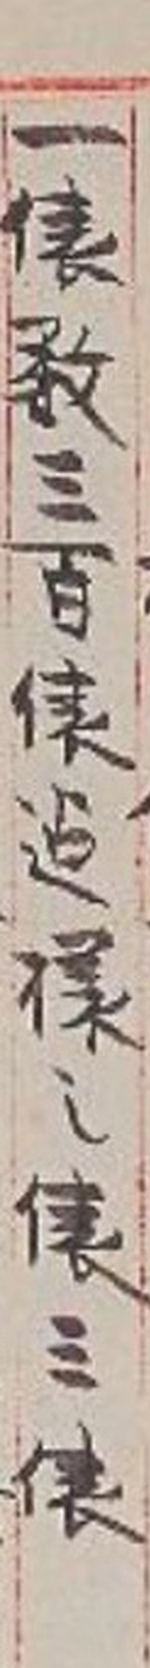一俵数三百俵迄様シ俵三俵
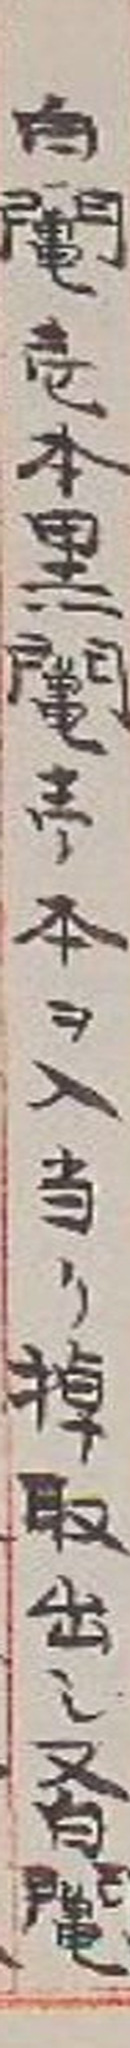白鬮壱本黒鬮壱本ヲ入当リ棹取出シ又白鬮
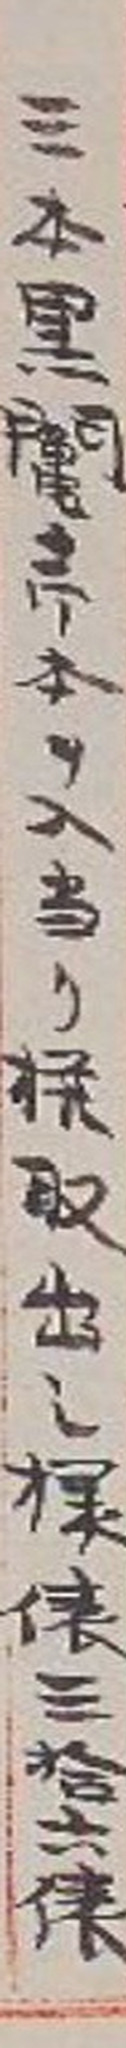三本黒鬮壱本ヲ入当リ栟取出シ様俵三拾六俵
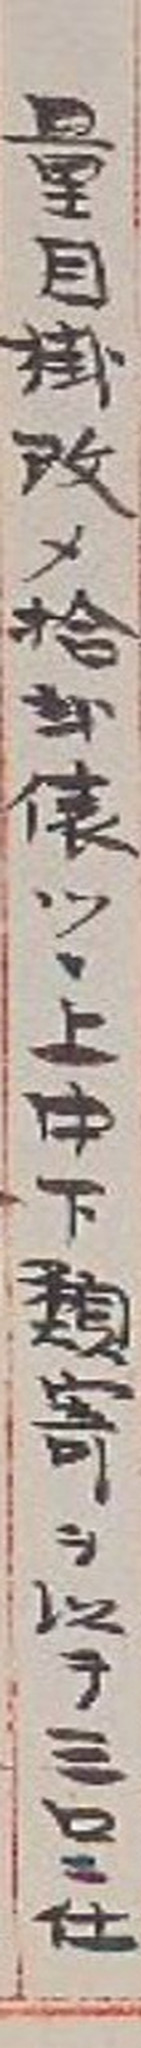量目掛改メ拾弐俵ツヽ上中下類寄ヲ以テ三口ニ仕
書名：貢納物品領収旧藩慣例並ニ置県後取扱順序
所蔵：University of the Ryukyus Library
